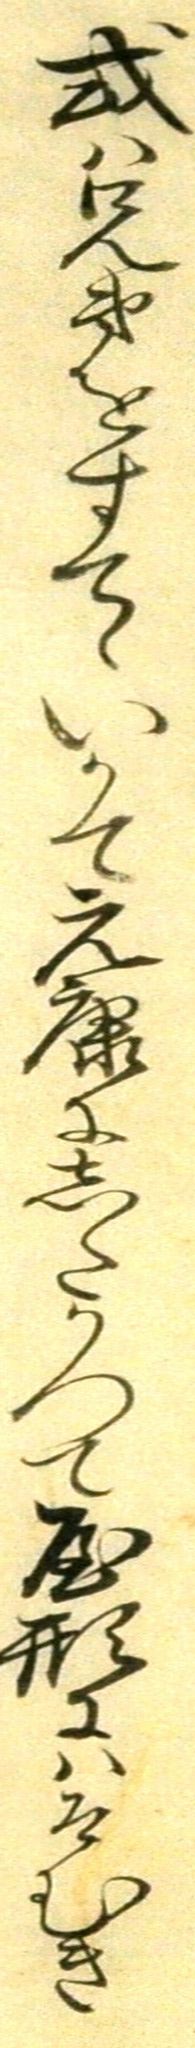或は兄弟をすてゝいかて元康にしたかつて屋形にはそむき
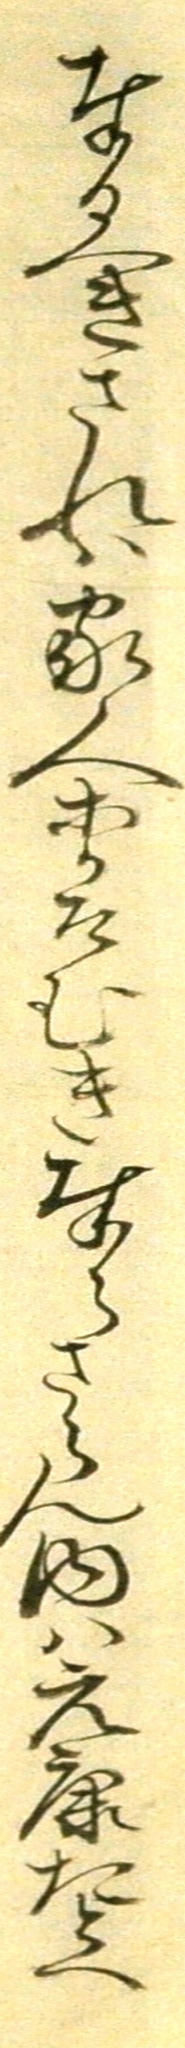奉るへきされは家人等かそむき奉らさらん内は元康たとへ
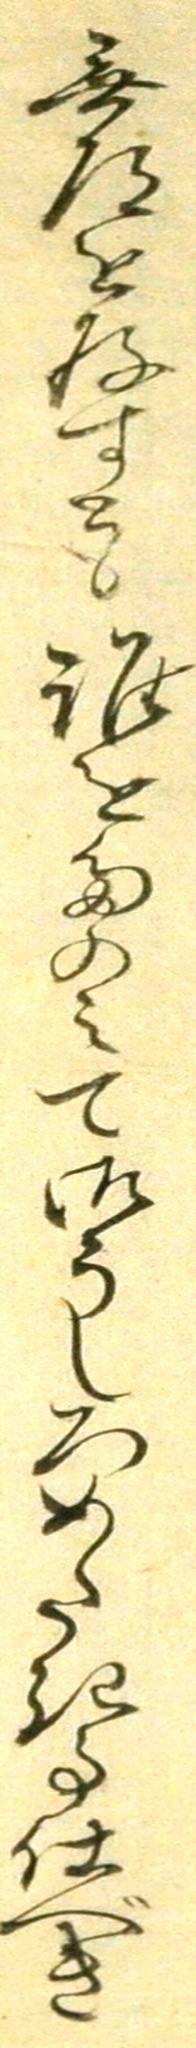無道を存すとも誰をたのみて御うしろめたき事仕べき
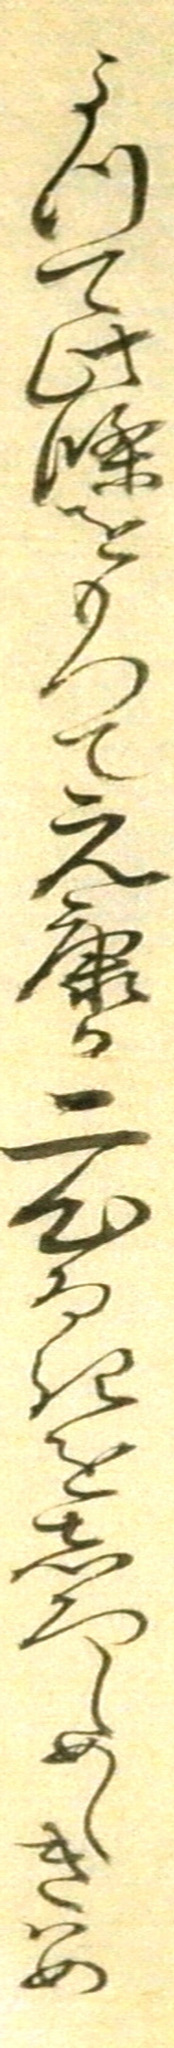よつて此条をもつて元康か二心なきをしろしめしきはめ
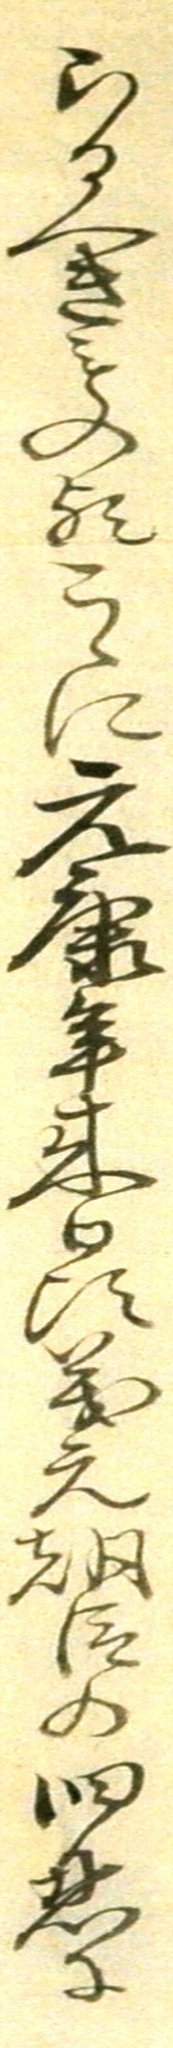らるへきものかこゝに元康年来日頃義元朝臣の旧恩に
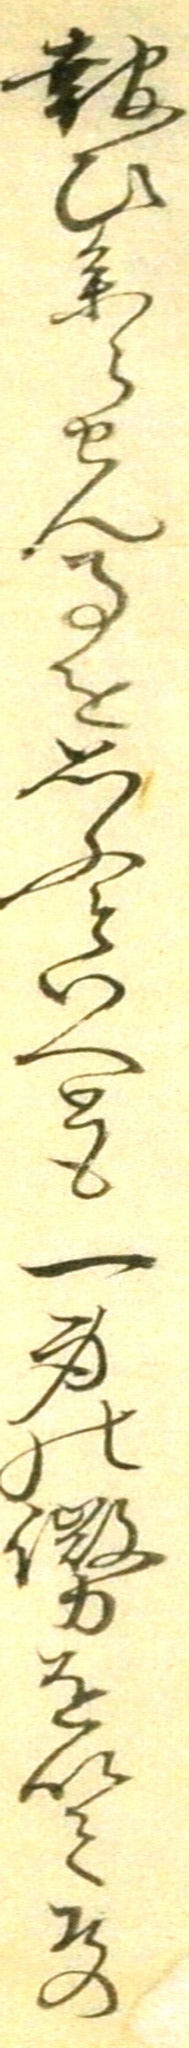報ひ参らせん事を思ふといへとも一身の微力を以てその
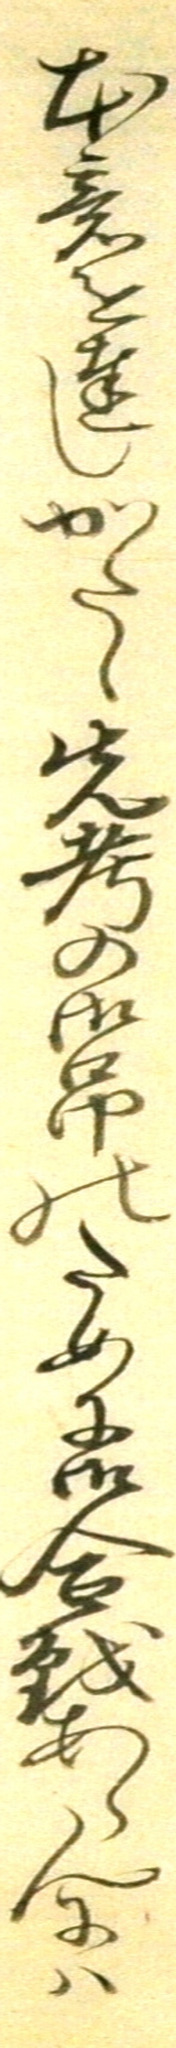本意を達しかたし先考の御弔のために御合戦あらんには
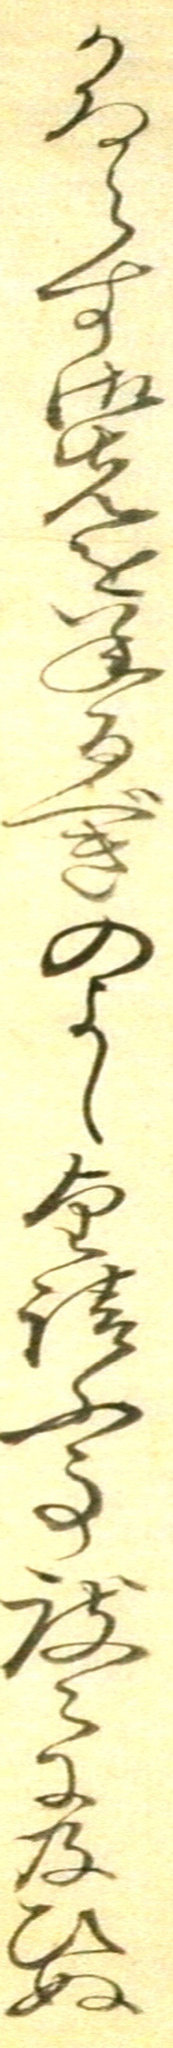かならす御先を承るべきのよし望請ふ事度々に及ひぬ
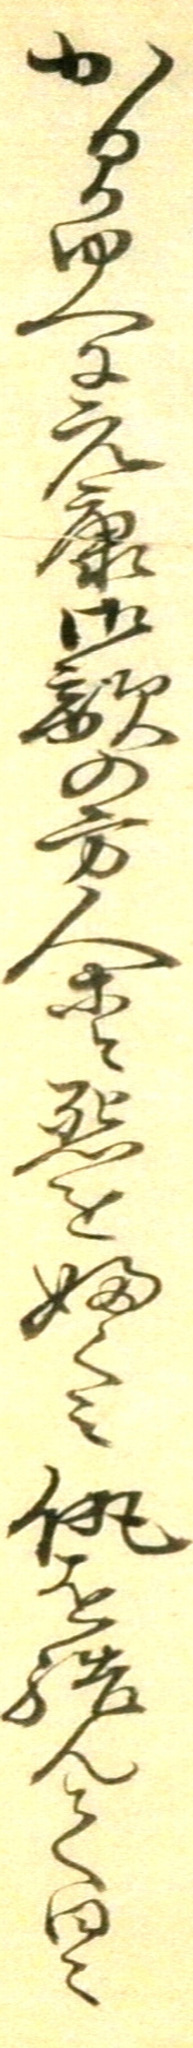かるかゆへに元康御敵の方人等と怨をふくみ仇を結んて日々
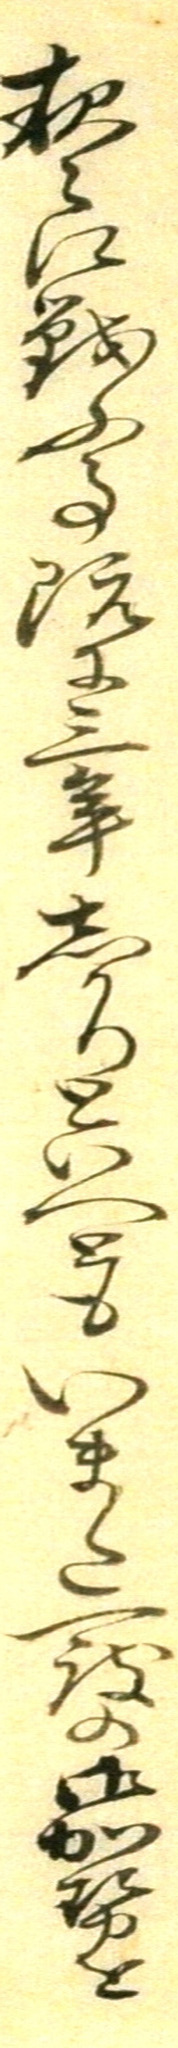夜々に戦ふ事既に三年しかりといへともいまた一度の御加勢を
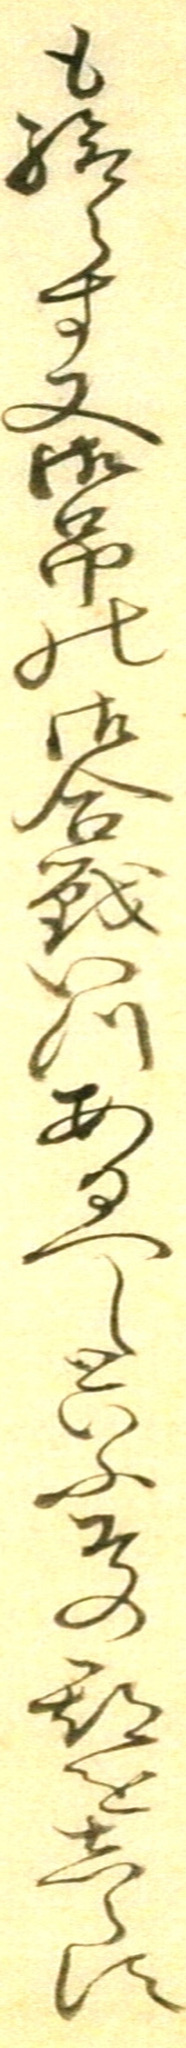も給らす又御弔の御合戦いつあるへしといふその期をしらす
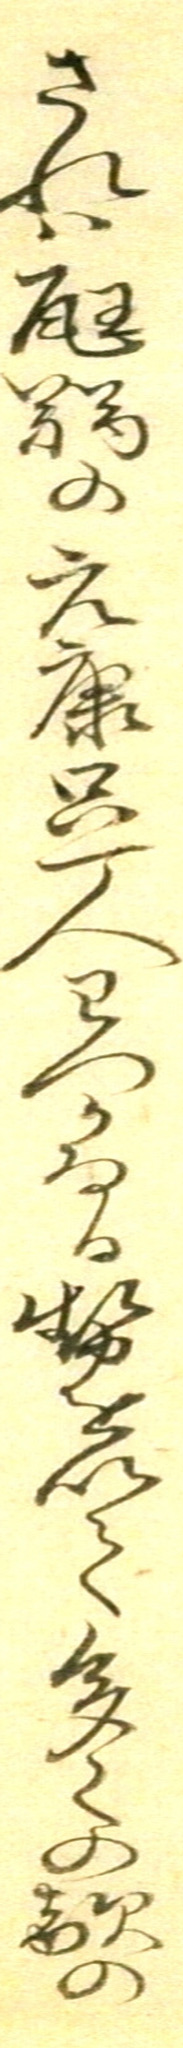されは尩弱の元康只一人わつかなる勢を以て多くの敵の
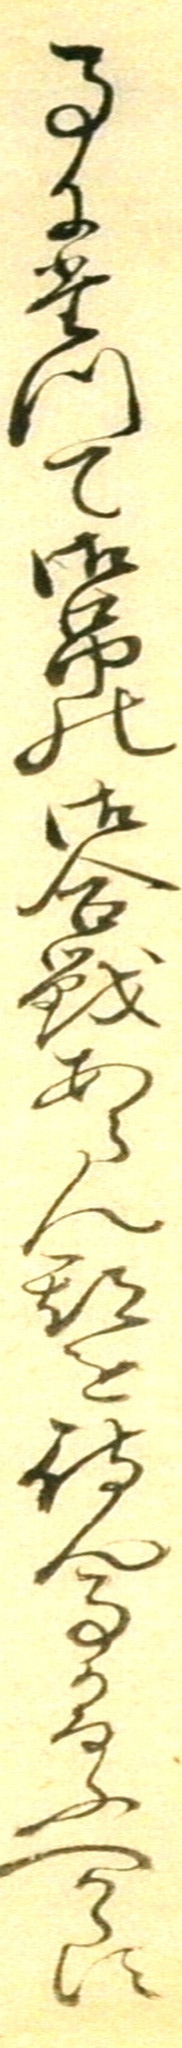事にたつて御弔の御合戦あらん期を待ん事かなふへからす
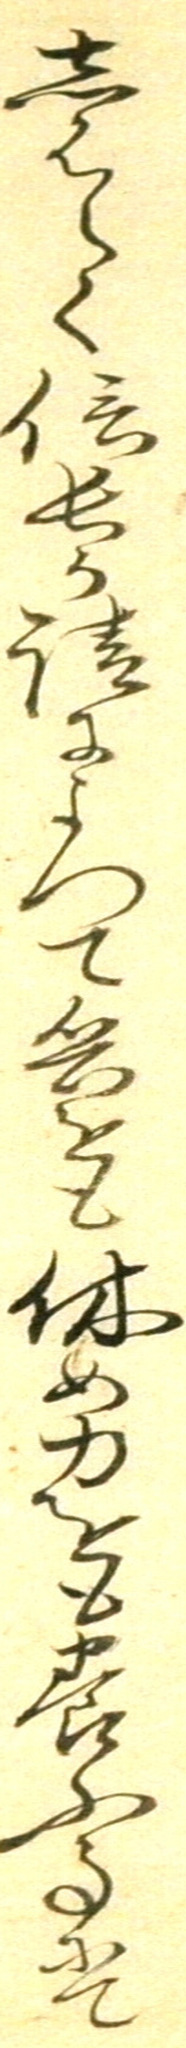しはらく信長か請によつて兵をも休め力をも養ふ事にて
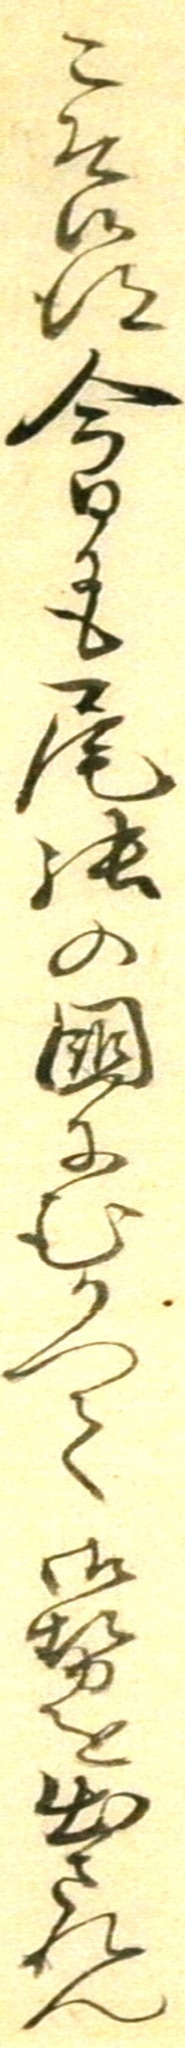こそ候得今日にも尾張の国にむかつて御勢を出されん
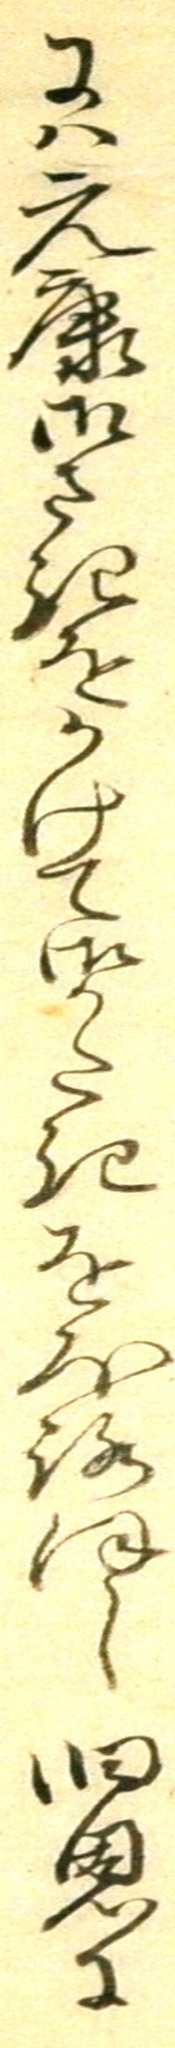には元康御さきをかけて御かたきをほろほし旧恩に
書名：藩翰譜（五）
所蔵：伊那市立高遠町図書館・合同会社AMANE
